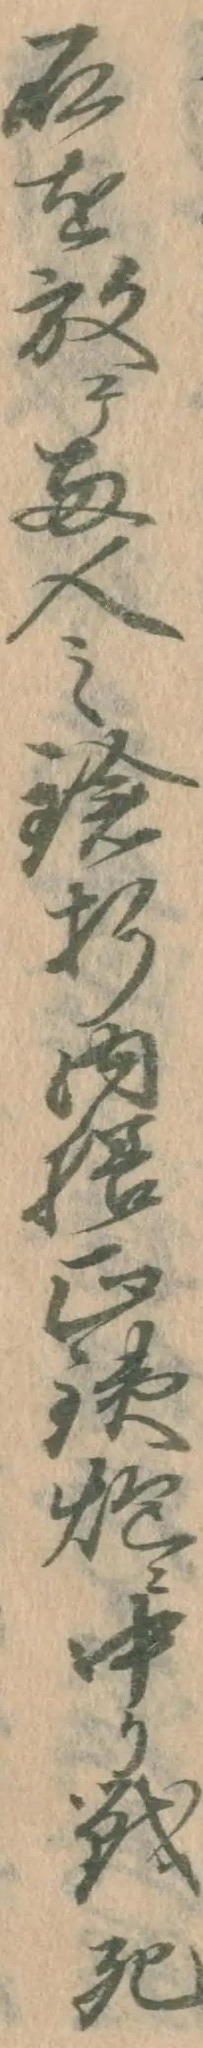石を放て両人之鎗折内膳正鉄炮に中り戦死
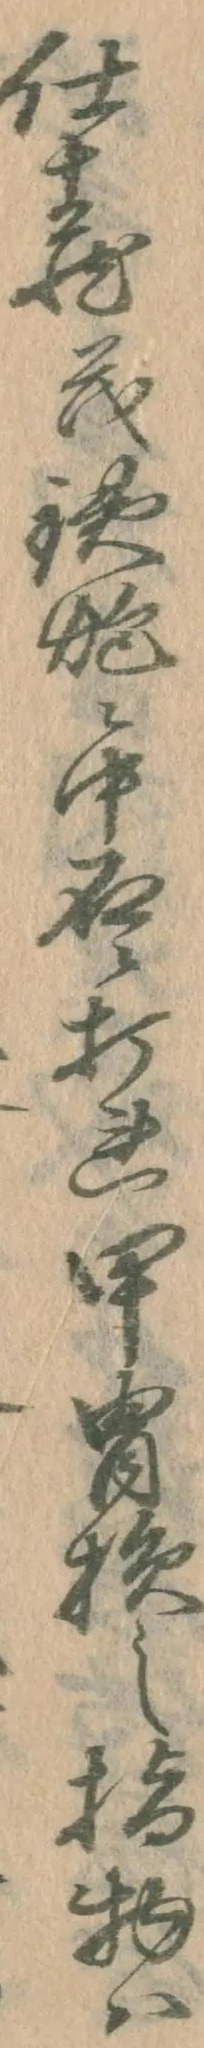仕十蔵茂鉄炮に中石に打連甲冑損し指物は
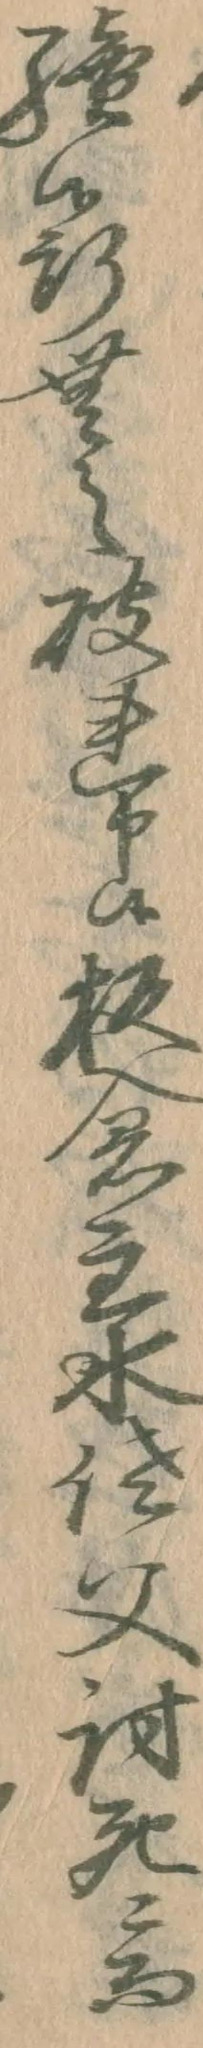強候所無之破連申候板倉主水佐父討死に而
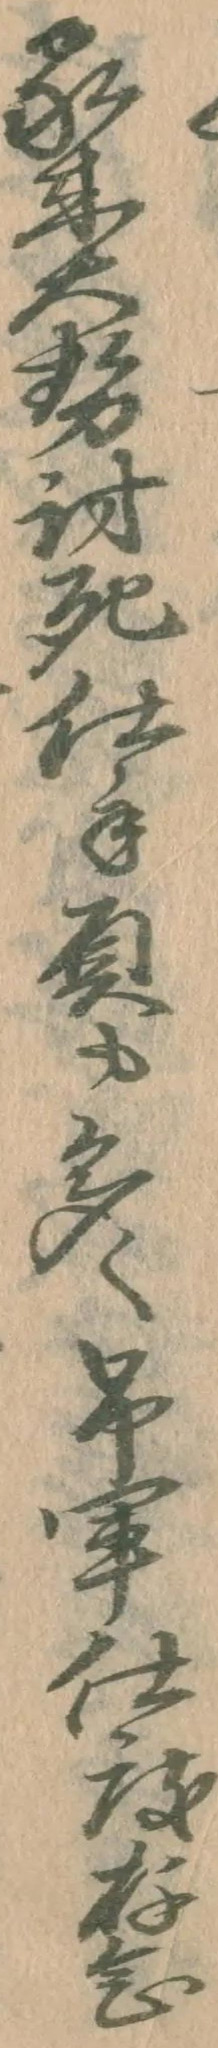家来大勢討死仕手負も多く弔軍仕度存念
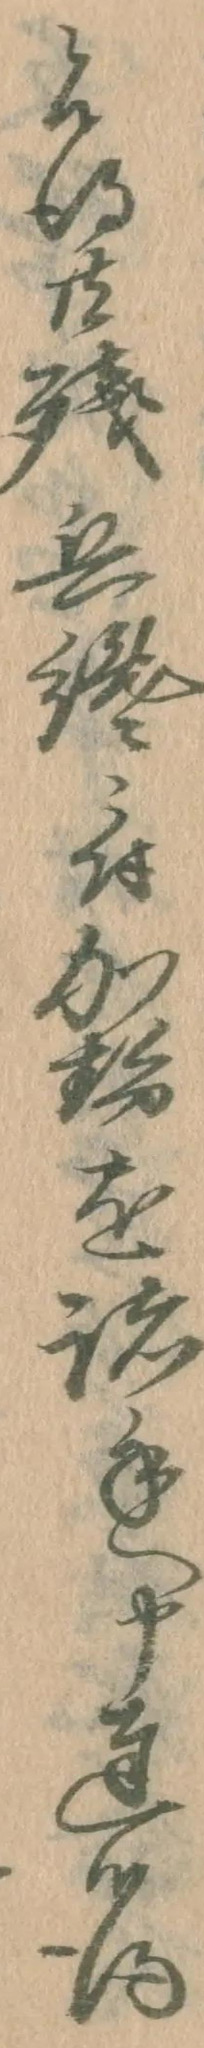に候得共残兵纔に付加勢を諸手へ申達候得
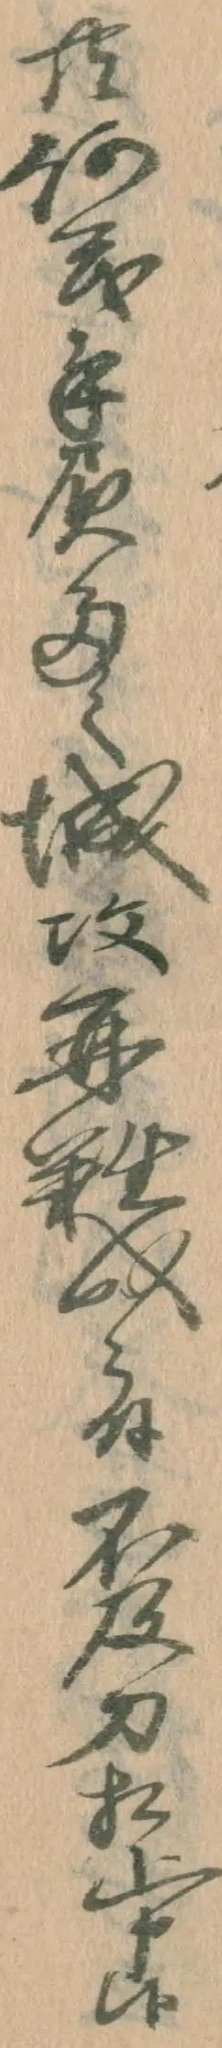共何茂手多く城攻再難成に付不及力相止申候
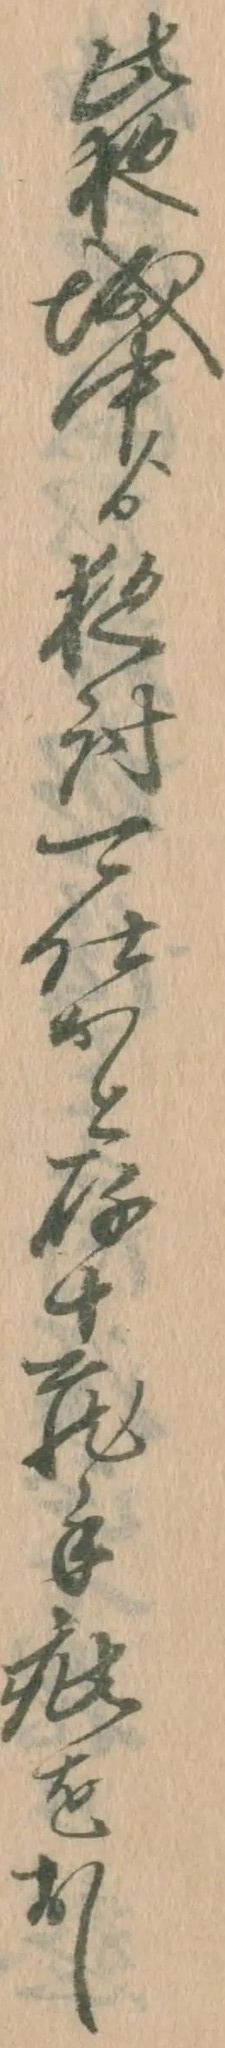此夜城中ゟ夜討可仕かと存十蔵手疵をなし
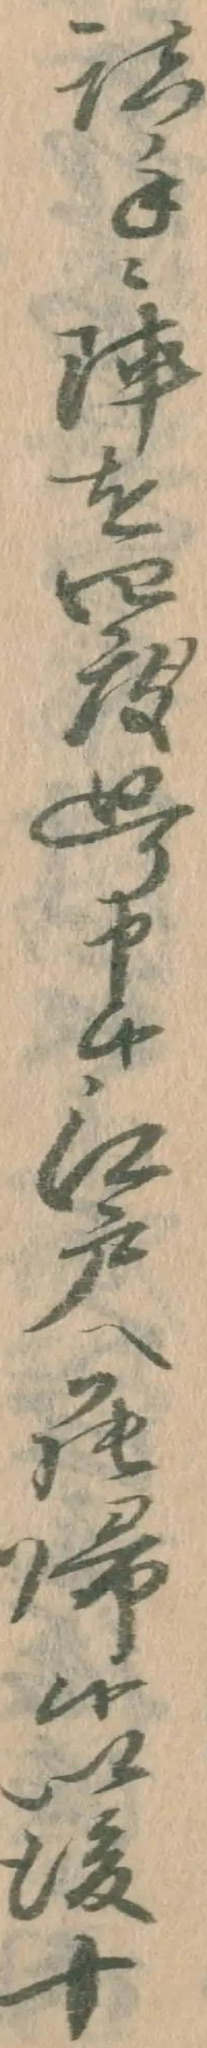諸手に陣を四度廻り申候江戸へ罷帰候以後十
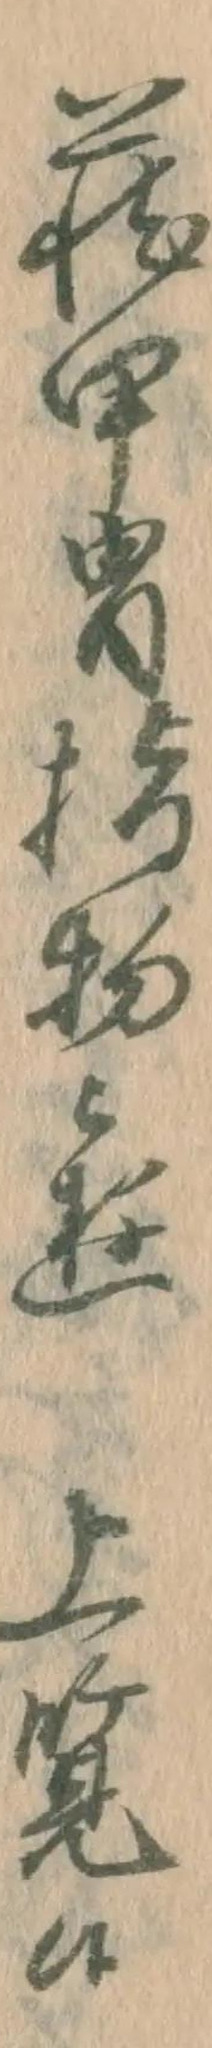蔵甲冑指物被遊上覧候
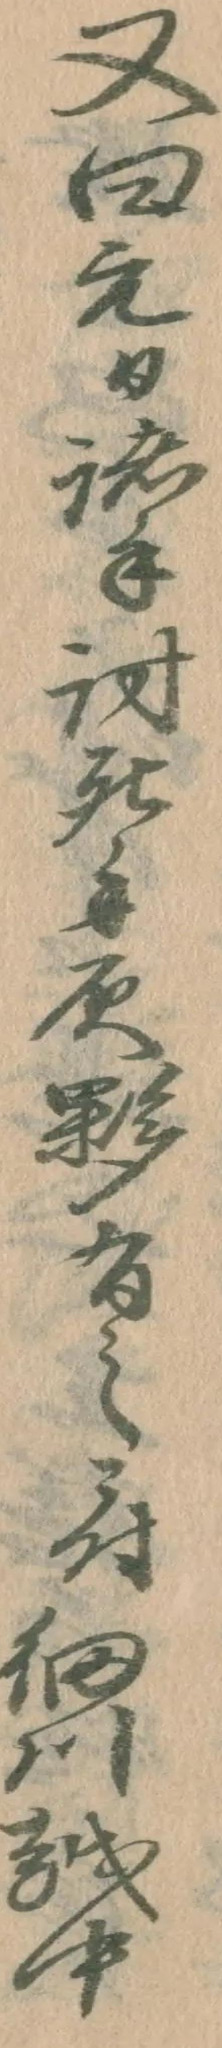又曰元日諸手討死手負夥有之に付細川越中
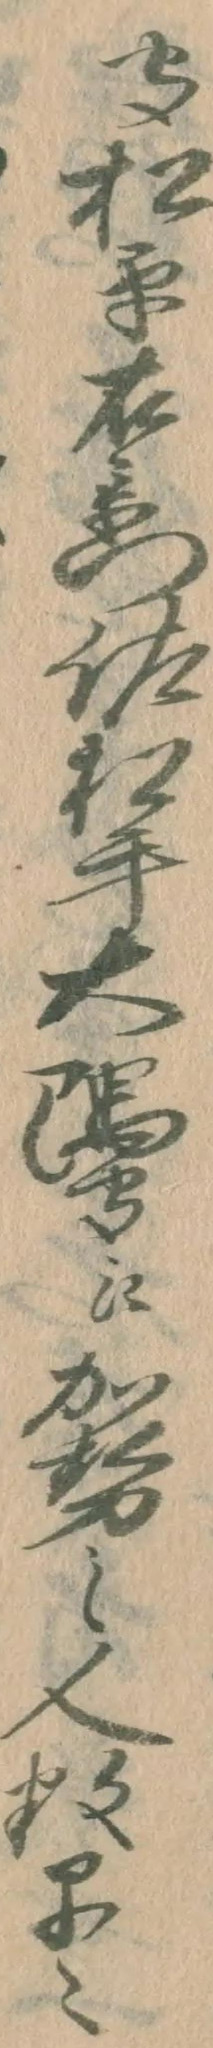守松平右衛門佐松平大隅守江加勢之人数早々
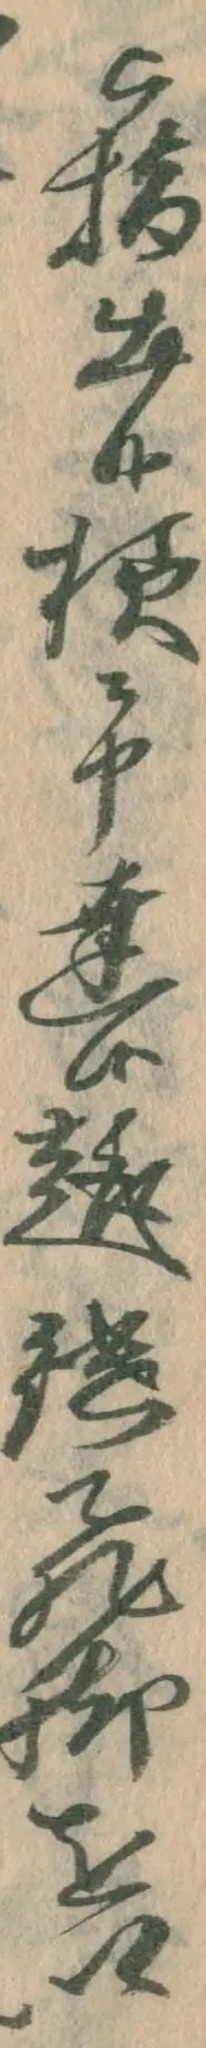被指出候様に申達候趣鑓飛脚を以
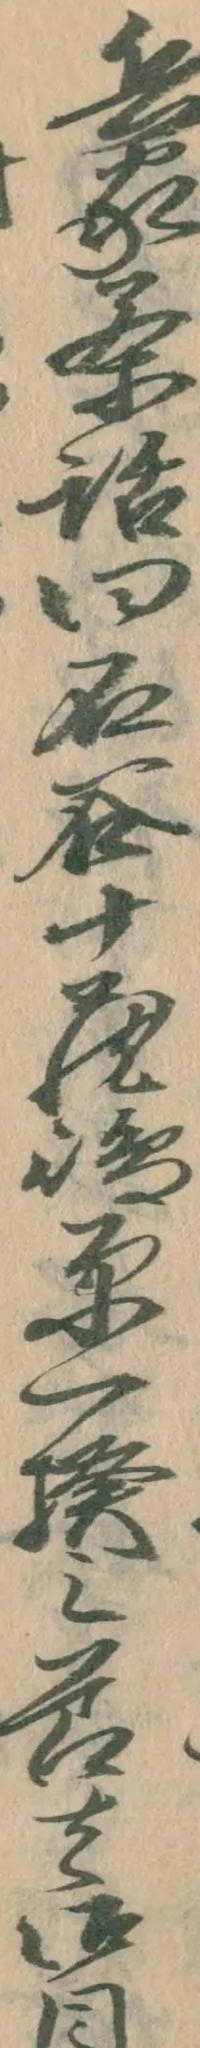兵家茶話曰石谷十蔵島原一揆之節者御目
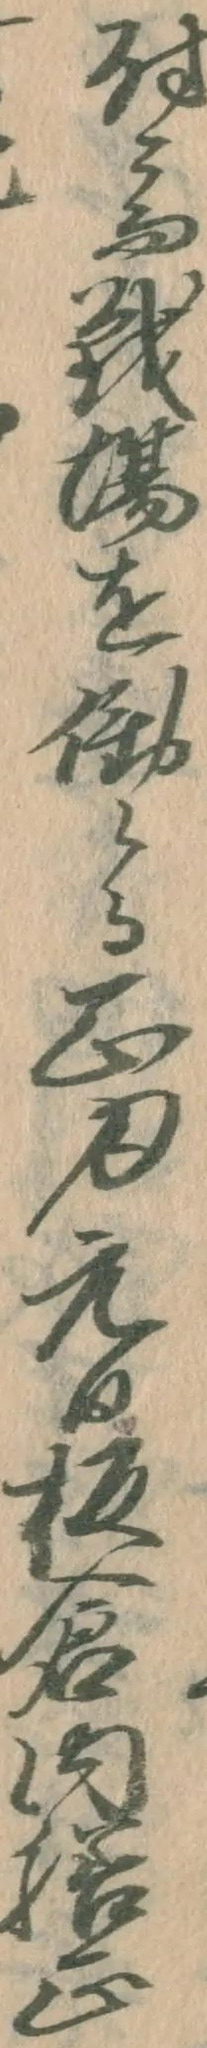付に而戦場を働くる正月元日板倉内膳正
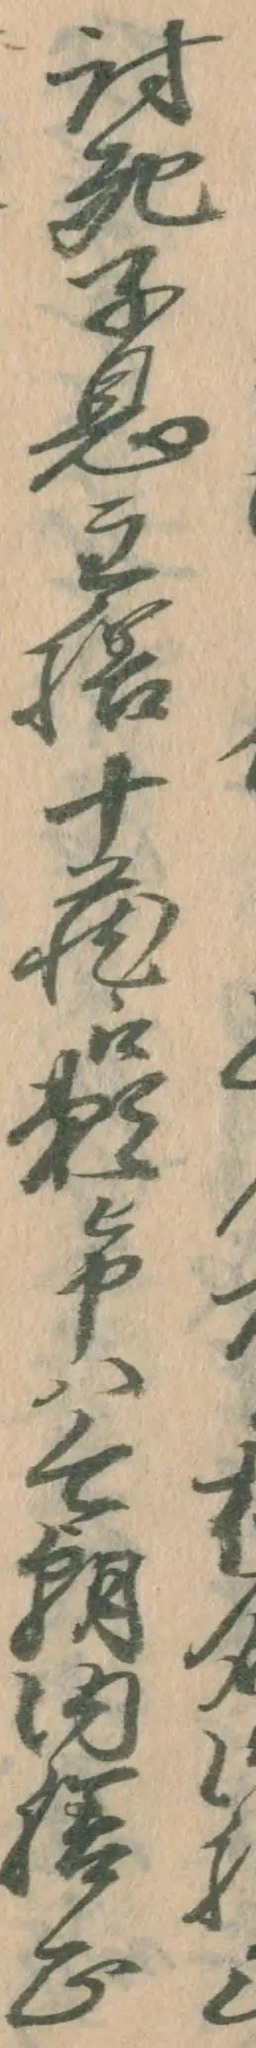討死子息主膳十蔵江頼被申は今朝内膳正
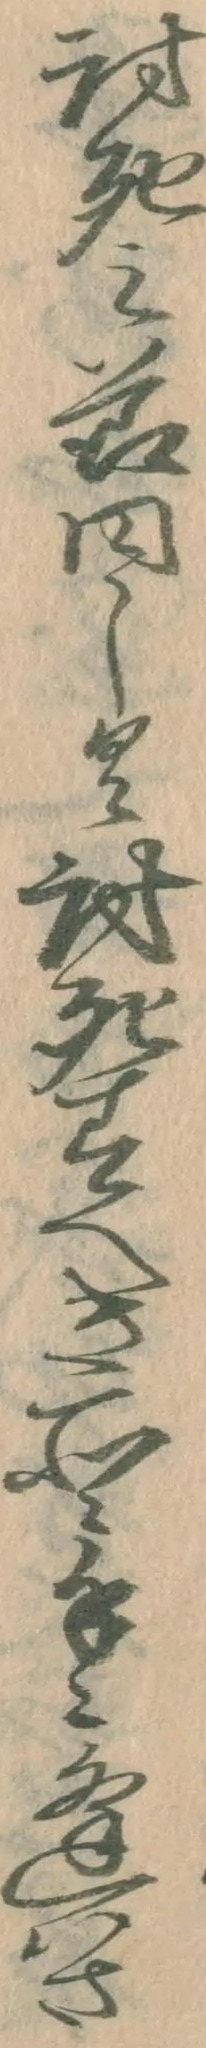討死之節同し具討死春へき所に手に逢はさ
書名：切支丹御退治記 49巻. [5]
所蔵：国立国会図書館 National Diet Library, JAPAN
